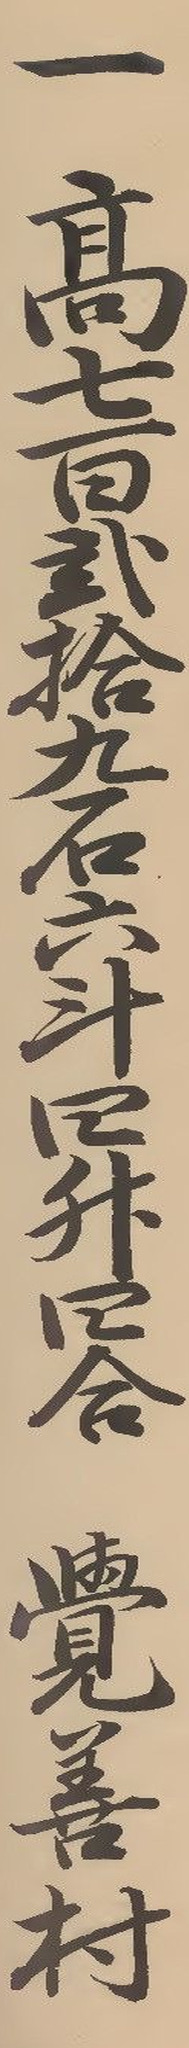一高七百弐拾九石六斗四升四合覚善村
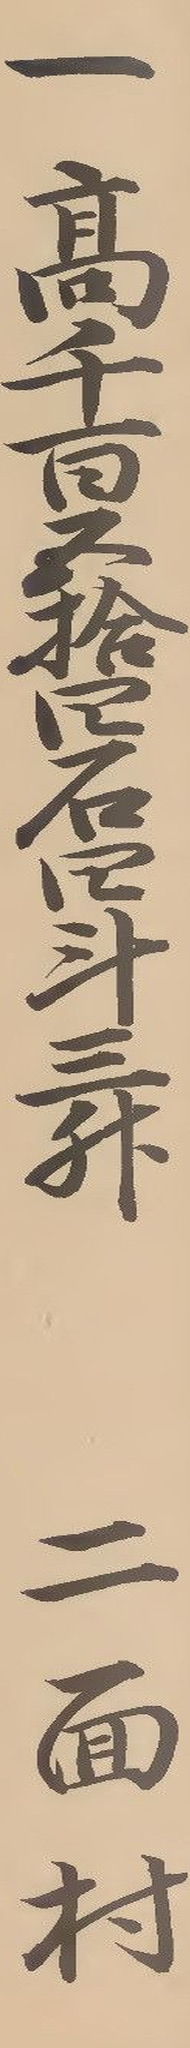一高千百五拾四石四斗三升二面村
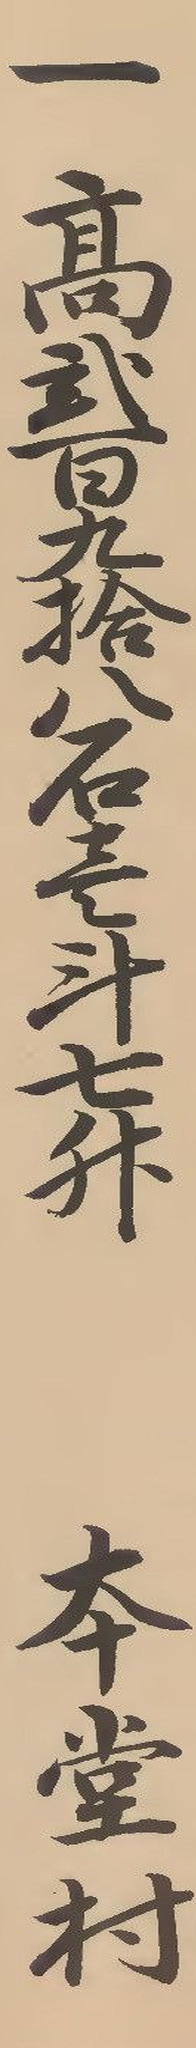一高弐百九拾八石壱斗七升本堂村
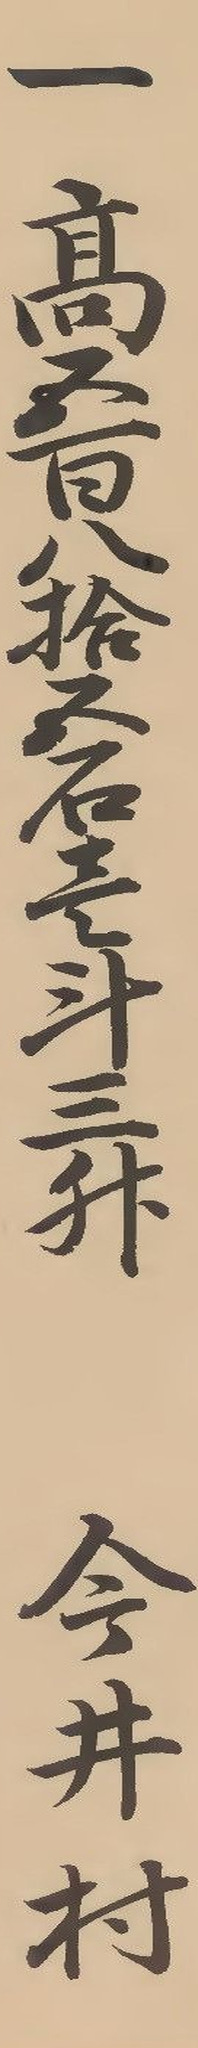一高五百八拾五石壱斗三升今井村
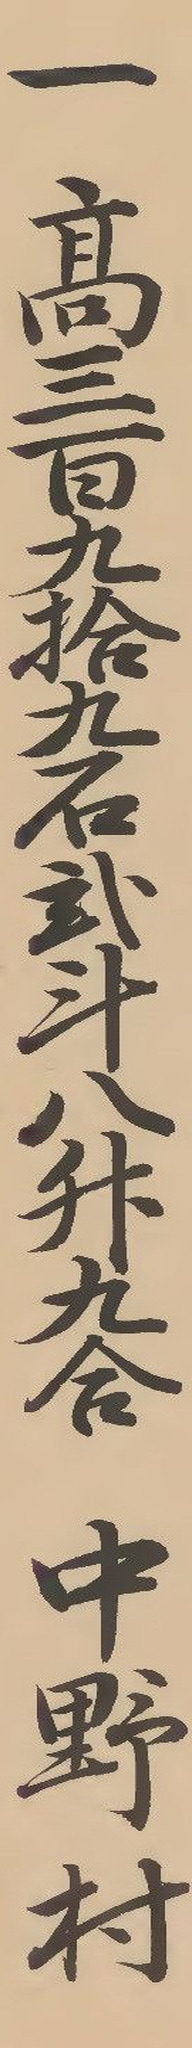一高三百九拾九石弐斗八升九合中野村

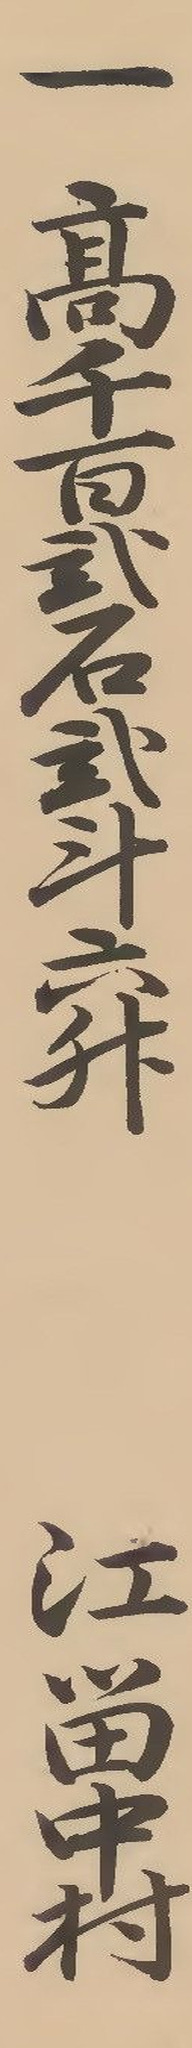一高千百弐石弐斗六升江留中村
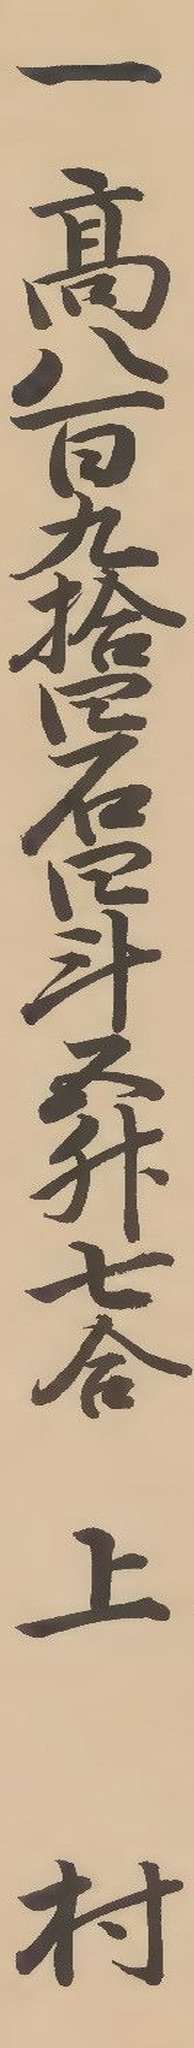一高八百九拾四石四斗五升七合上村
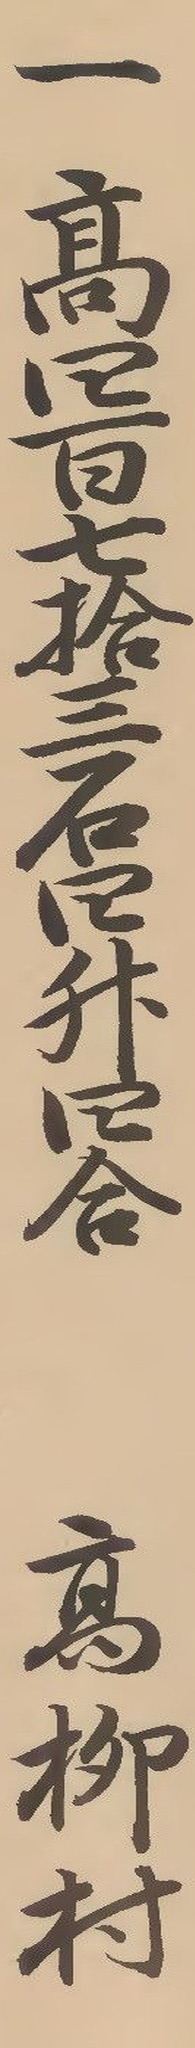一高四百七拾三石四升四合高柳村
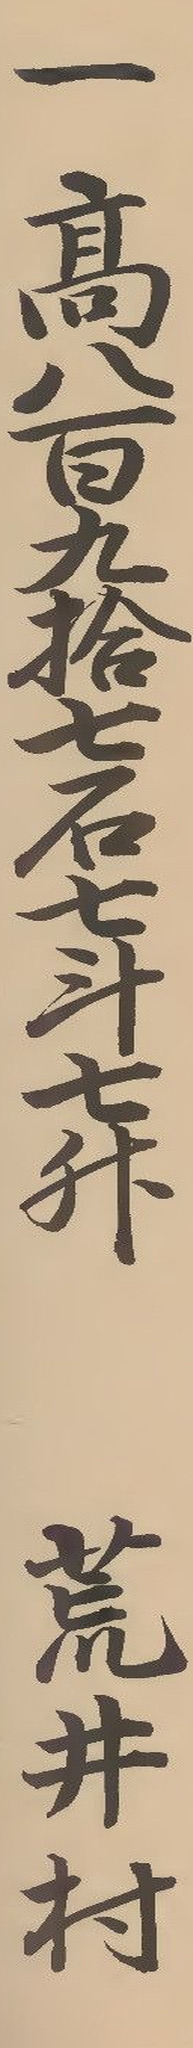一高八百九拾七石七斗七升荒井村
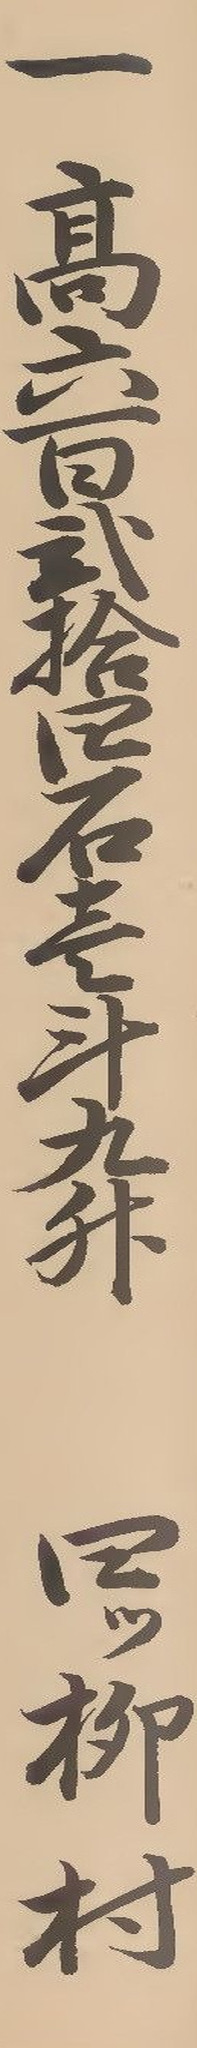一高六百弐拾四石壱斗九升四ツ柳村
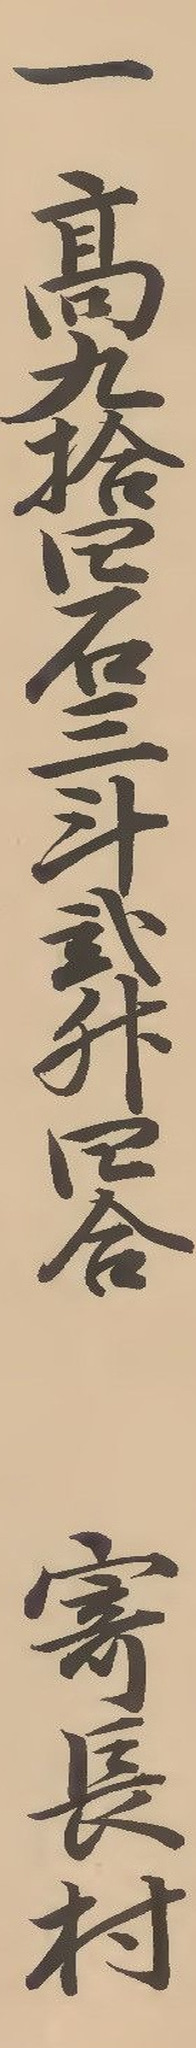一高九拾四石三斗弐升四合寄長村
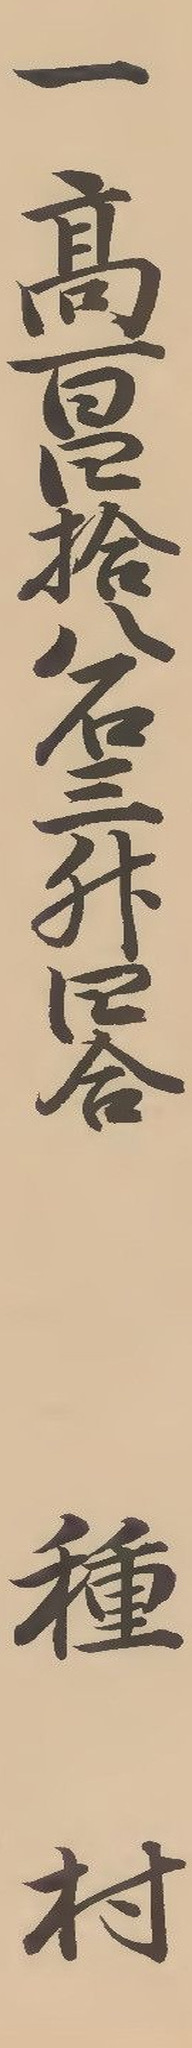一高百四拾八石三升四合種村
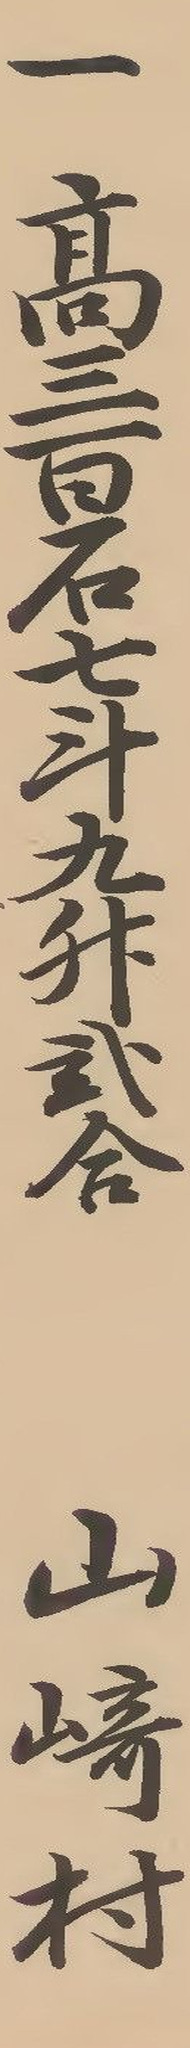一高三百石七斗九升弐合山崎村

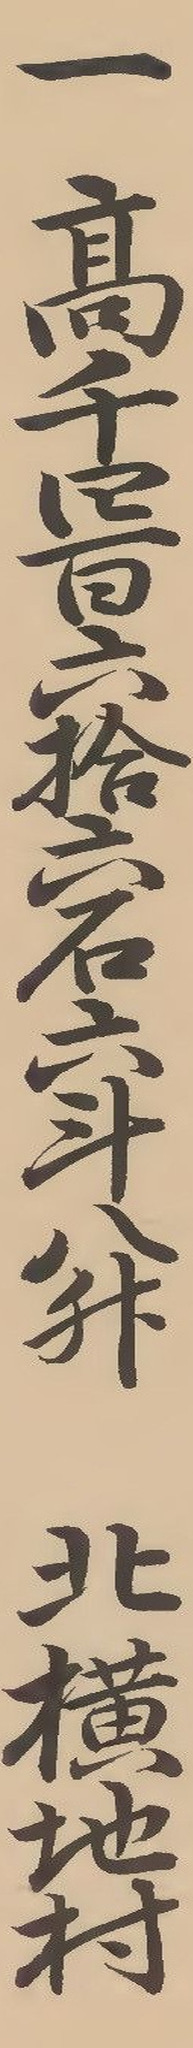一高千四百六拾六石六斗八升北横地村
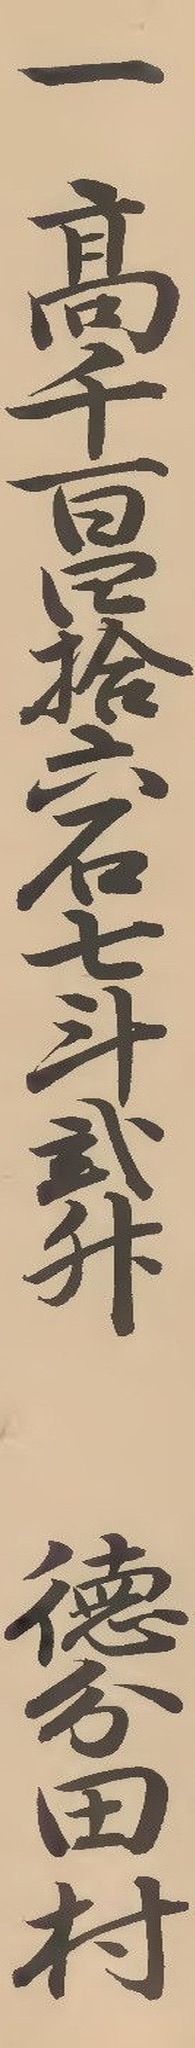一高千百四拾六石七斗弐升徳分田村
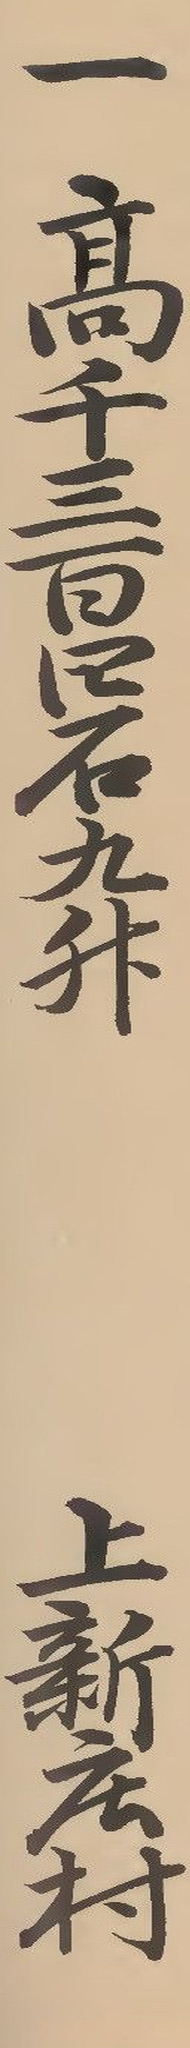一高千三百四石九升上新庄村
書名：越前国郷帳
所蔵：国立公文書館 National Archives of Japan
